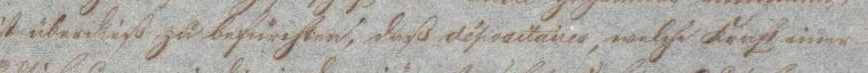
ist überdieß zu befürchten, daß dépositaires, welche Kraft einer
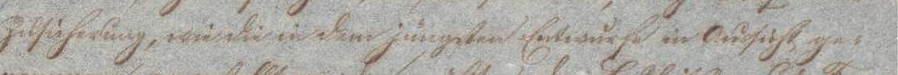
Zusicherung, wie die in dem jüngsten Entwurfe in Aussicht ge-
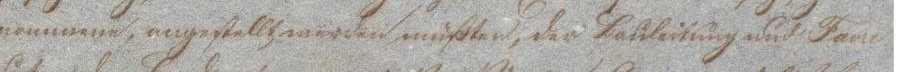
nommene, angestellt werden müßten, der Bauleitung und Favre
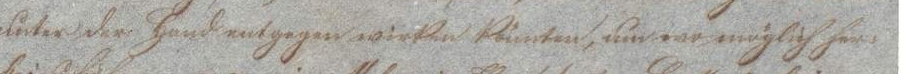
unter der Hand entgegen wirken könnten, um wo möglich her-
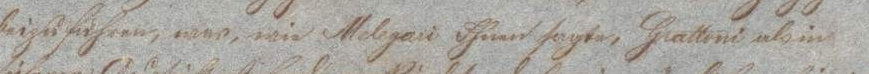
beizuführen, was, wie Melegari Ihnen sagte, Grattoni als in
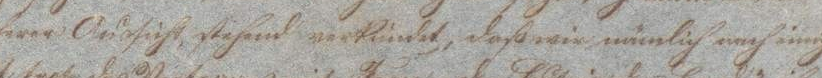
sicherer Aussicht stehend verkündet, daß wir nämlich nach einiger
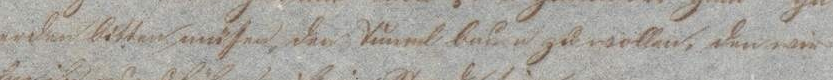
werden bitten müssen, den Tunnel bauen zu wollen, den wir
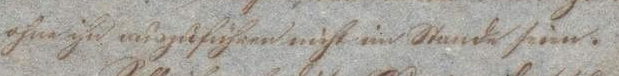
ohne ihn auszuführen nicht im Stande seien.
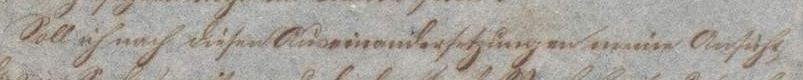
Soll ich nach diesen Auseinandersetzungen meine Ansicht
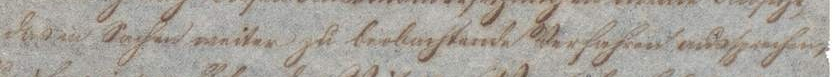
das in Sachen weiter zu beobachtende Verfahren aussprechen,
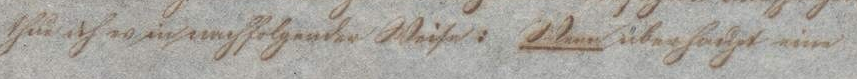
thue ich es in nachfolgender Weise: Wenn überhaupt eine
